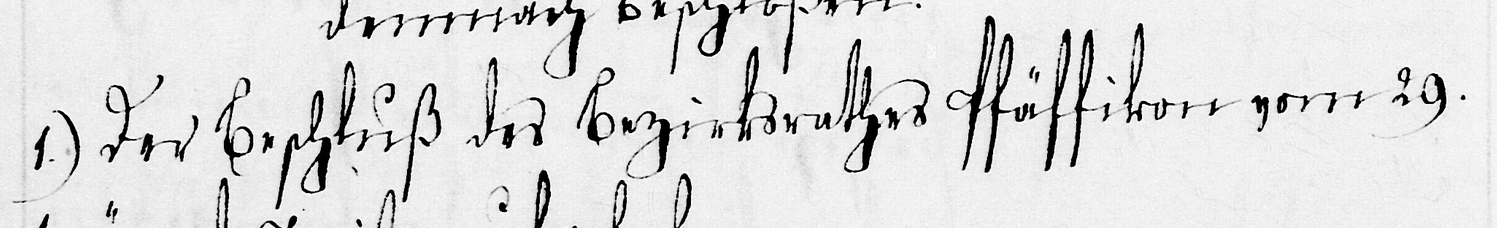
1.) Der Beschluß des Bezirksrathes Pfäffikon vom 29.
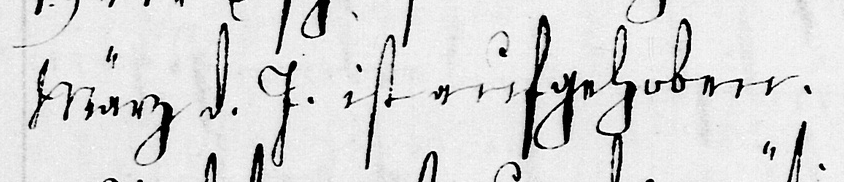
März d. J. ist aufgehoben.
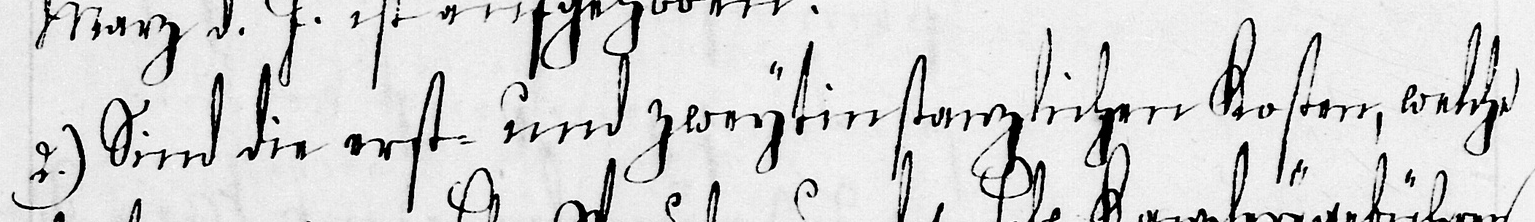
2.) Sind die erst- und zweytinstanzlichen Kosten, welche
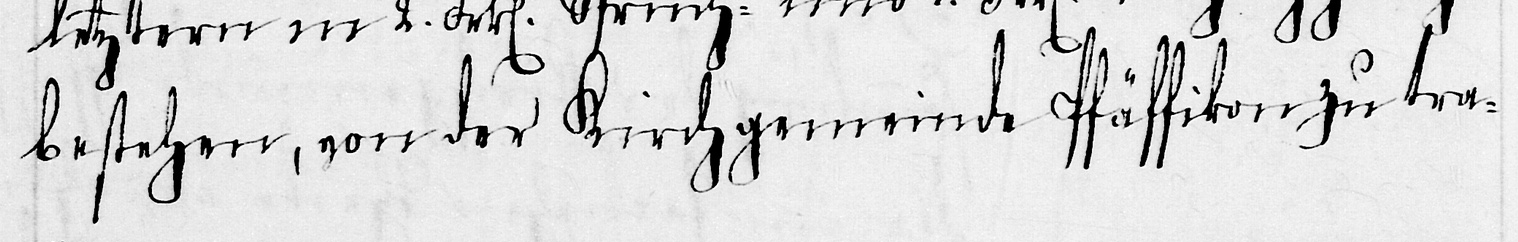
bestehen, von der Kirchgemeinde Pfäffikon zu tra¬
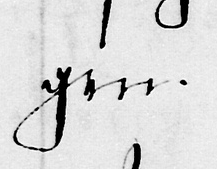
gen.
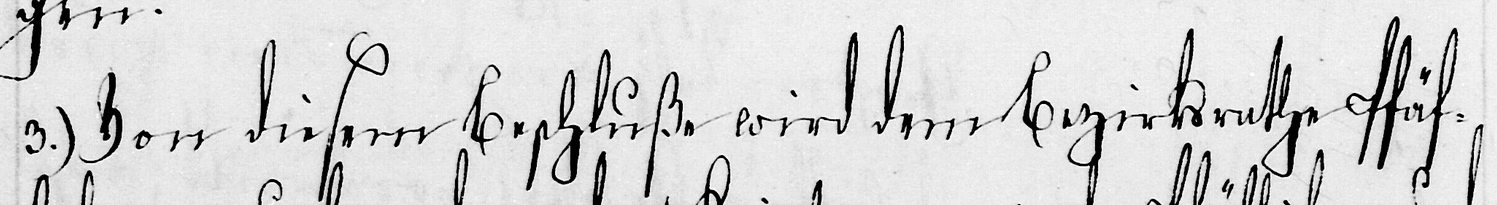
3.) Von diesem Beschluße wird dem Bezirksrathe Pfäf¬
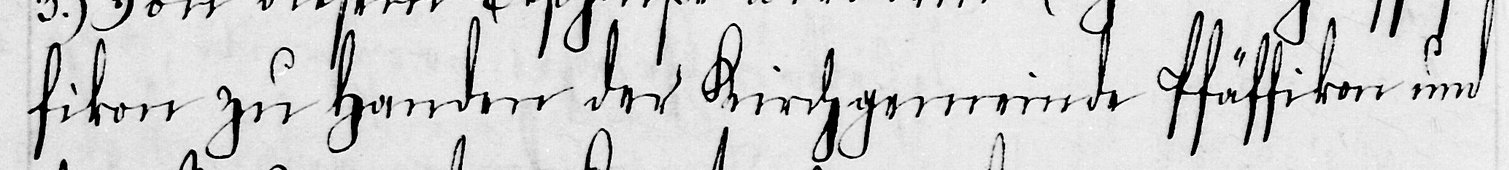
fikon zu Handen der Kirchgemeinde Pfäffikon und
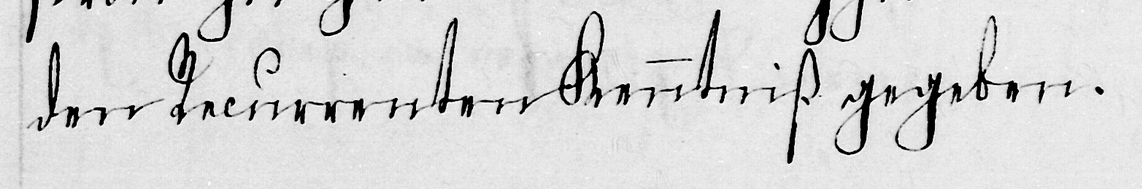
den Recurrenten Kenntniß gegeben.
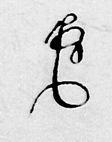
1.
